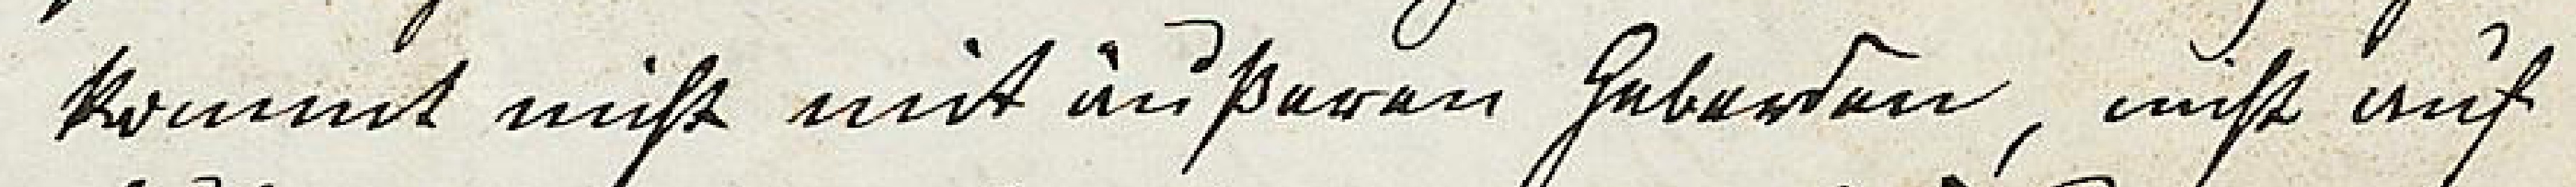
kommt nicht mit äußeren Geberden, nicht auf
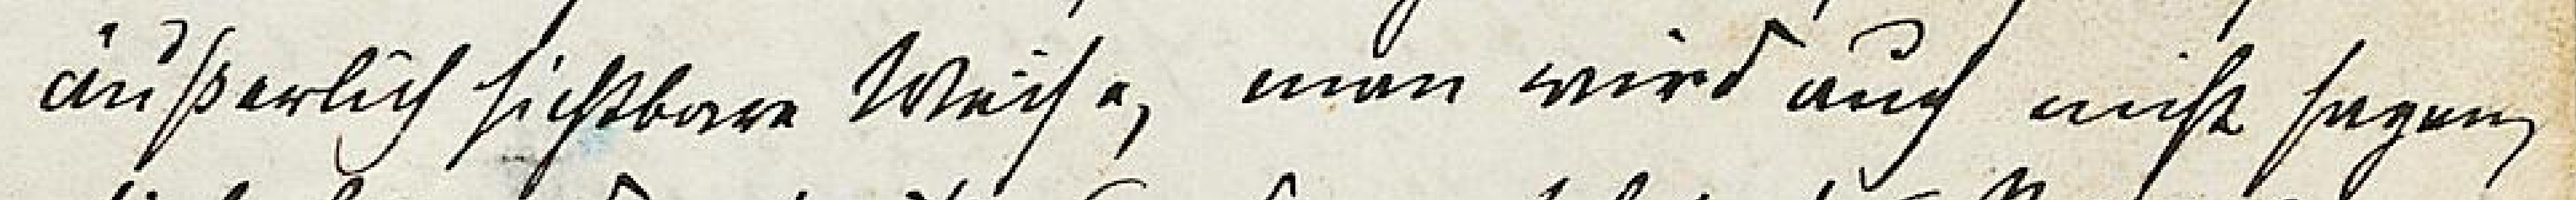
äußerlich sichtbare Weise, man wird auch nicht sagen,
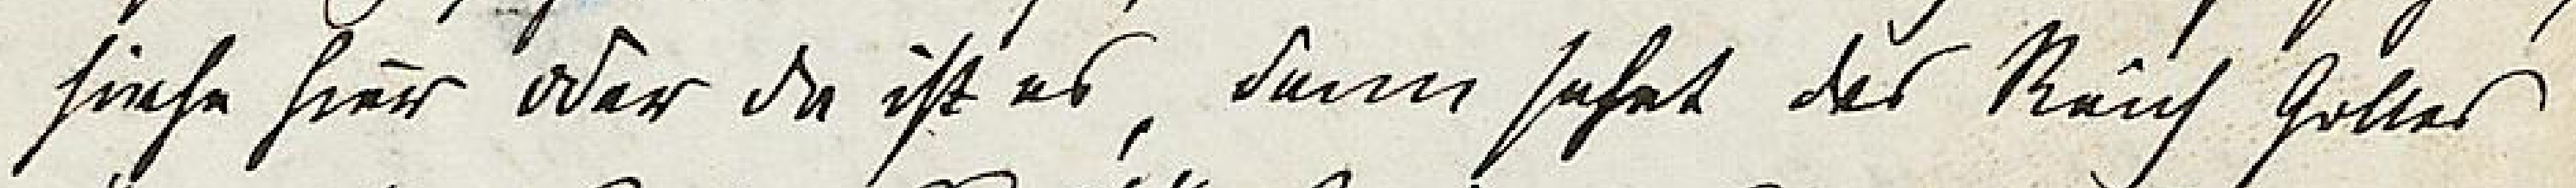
siehe hier oder da ist es, denn sehet das Reich Gottes
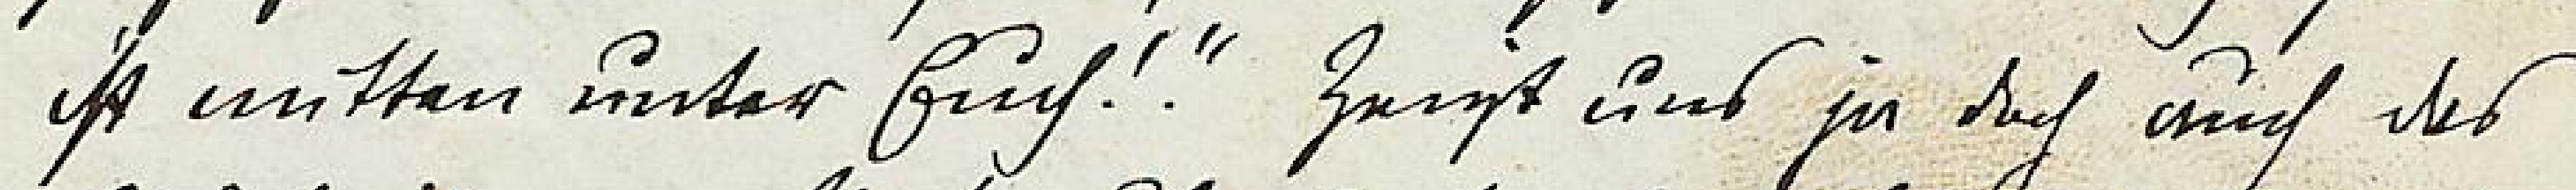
ist mitten unter Euch!" Zeigt uns ja doch auch das
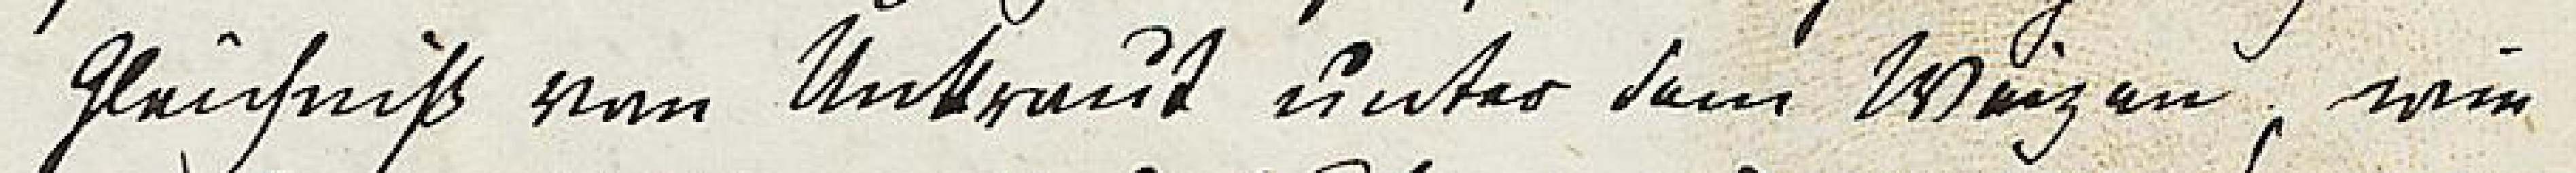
Gleichniß vom Unkraut unter dem Weizen, wie
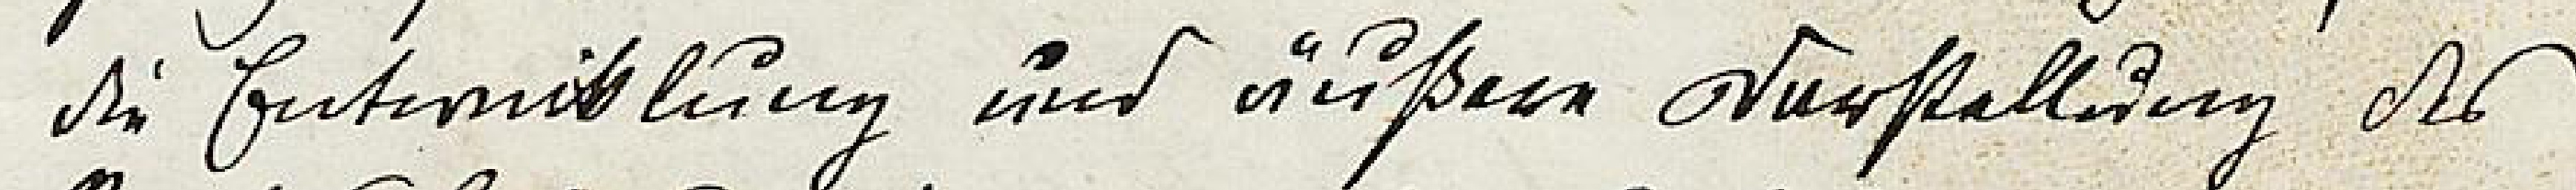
die Entwicklung und äußere Darstellung des
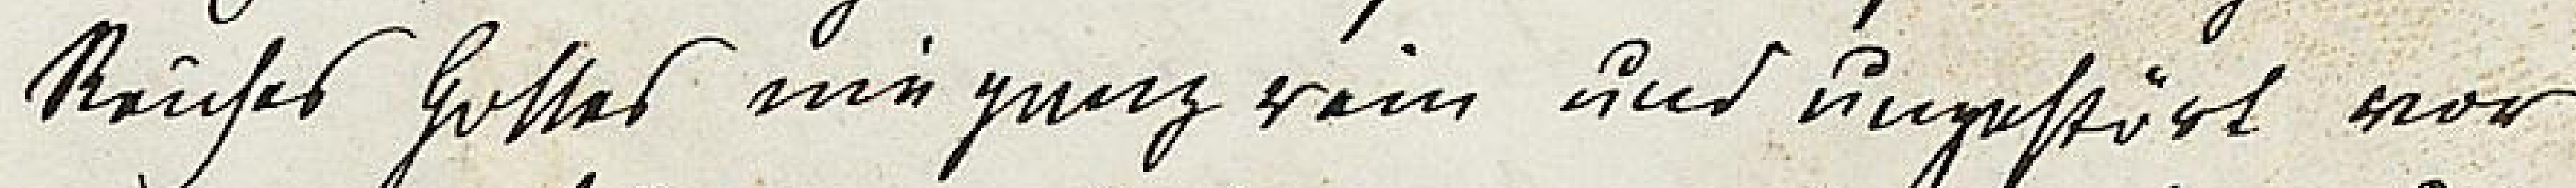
Reiches Gottes nie ganz rein und ungestört vor
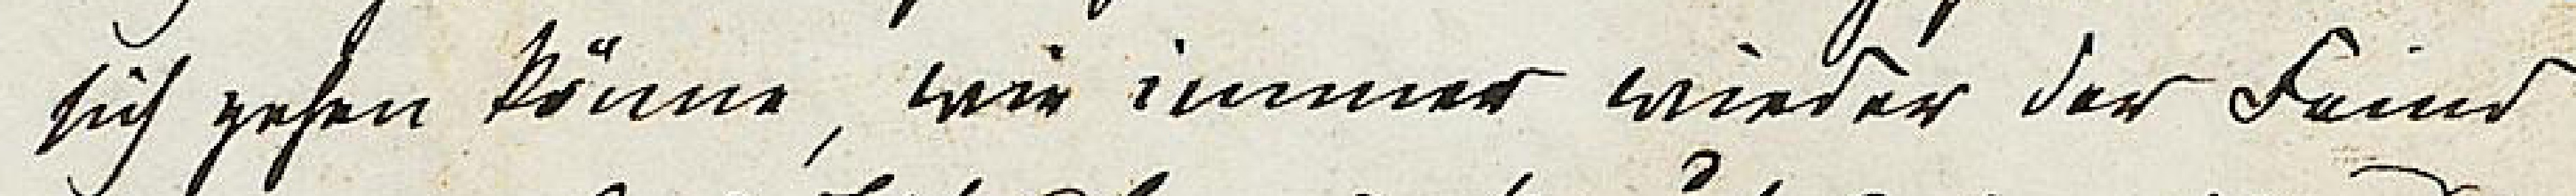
sich gehen könne, wie immer wieder der Feind
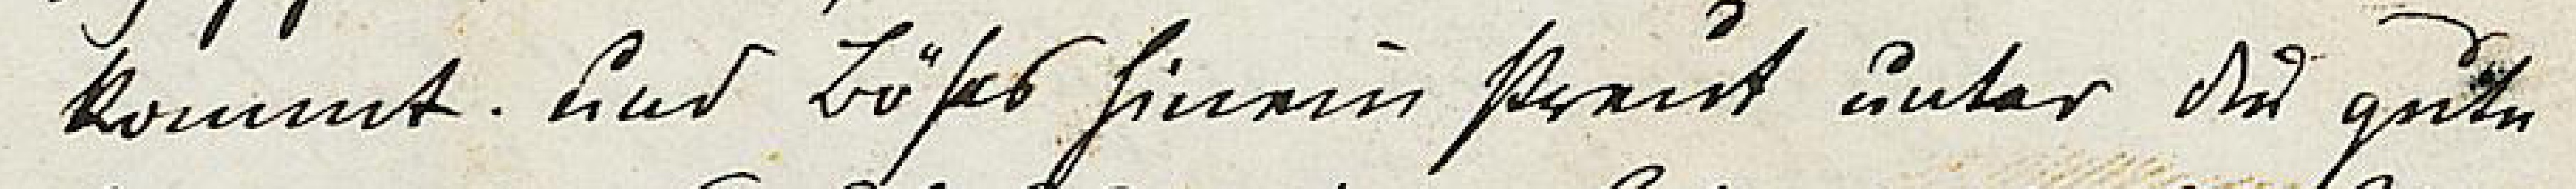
kommt und Böses hinein streut unter die gute
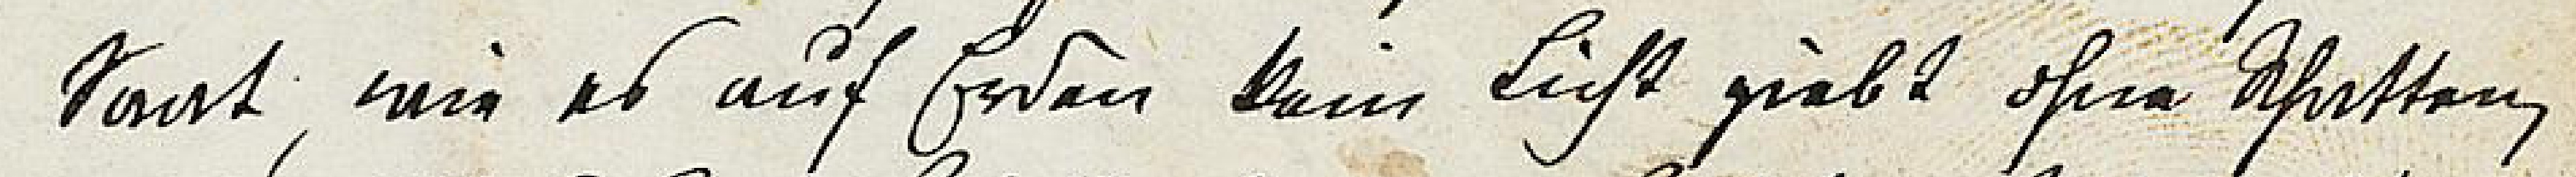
Saat, wie es auf Erden kein Licht giebt ohne Schatten,
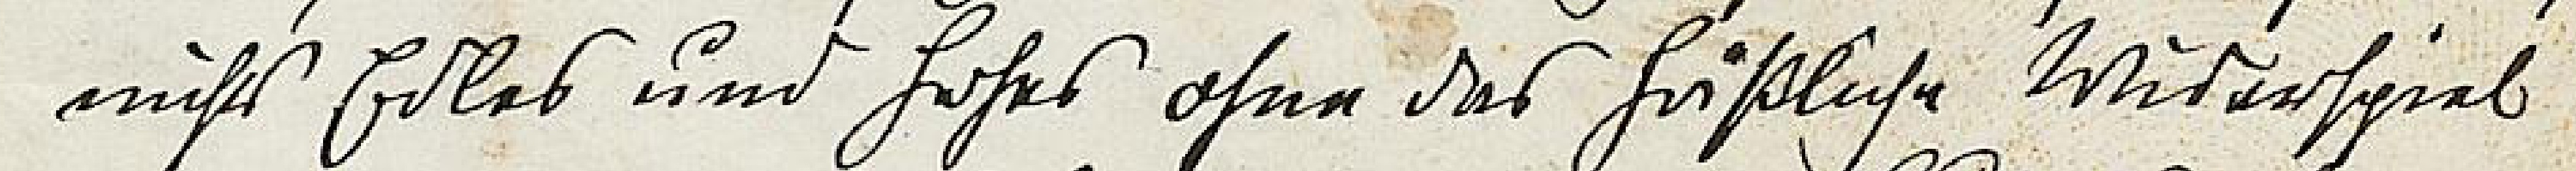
nichts Edles und Hohes ohne das Häßliche Widerspiel
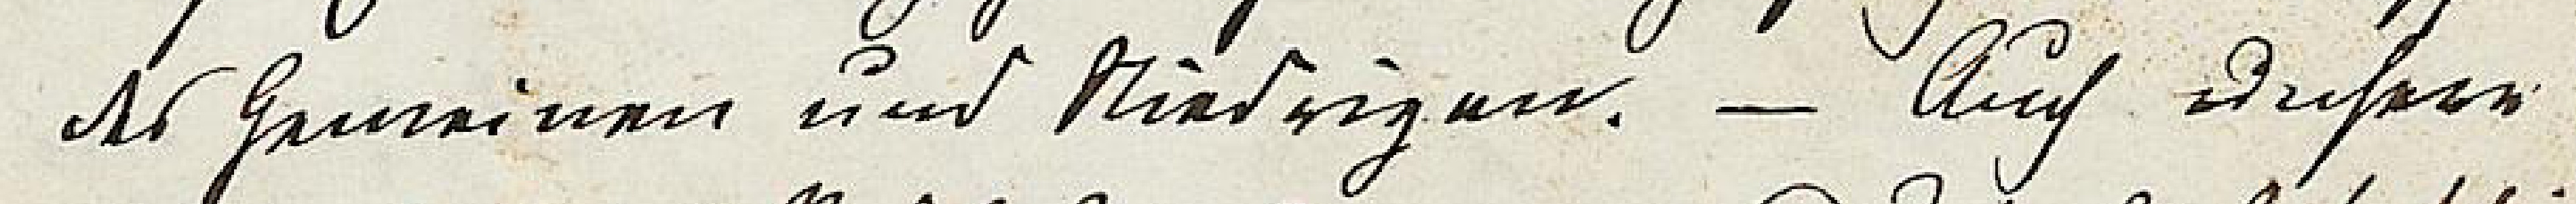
der Gemeinen und Niedrigen. _ Auch unsere
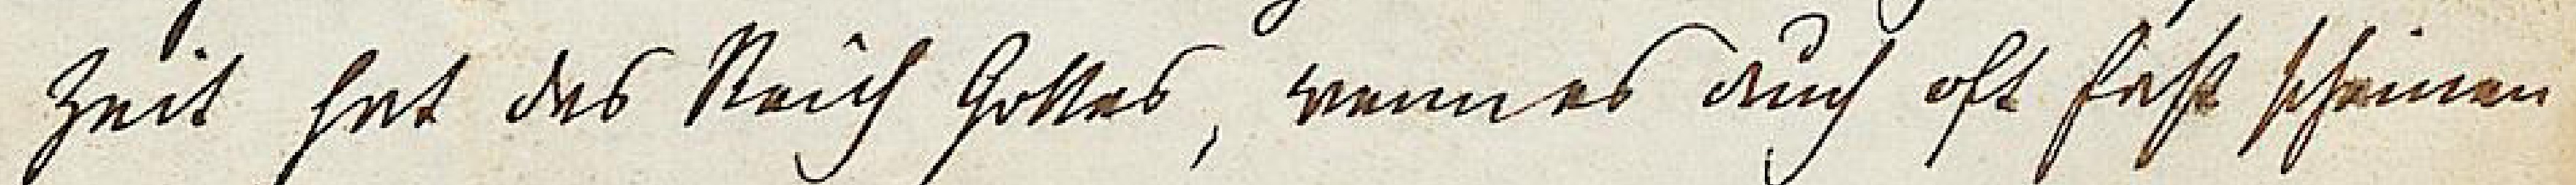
Zeit hat das Reich Gottes, wenn es auch oft fest scheinen
